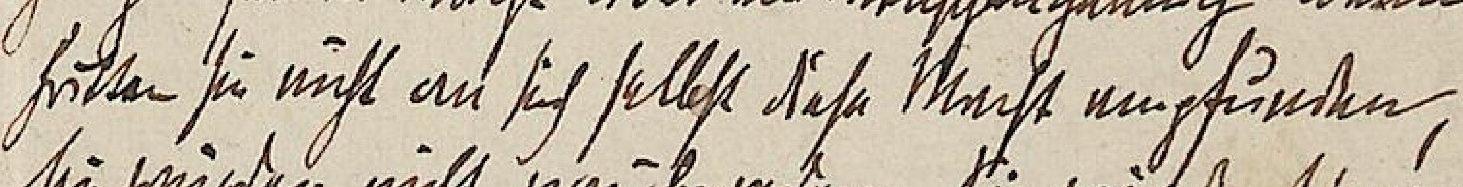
hätten sie nicht an sich selbst diese Macht empfunden,
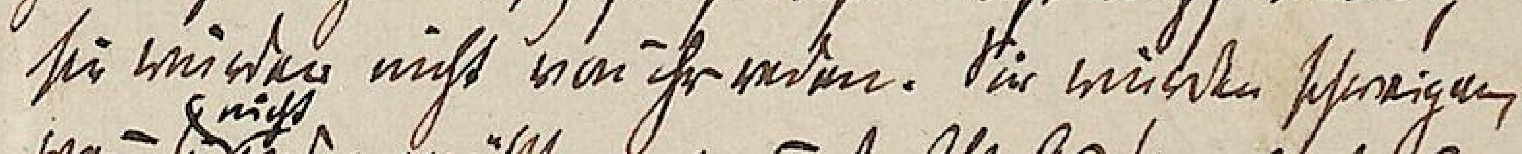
sie würden nicht von ihr reden. Sie würden schweigen,
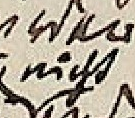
nicht
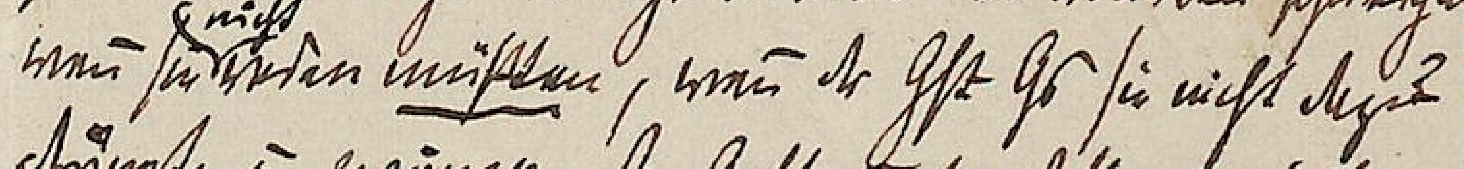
wen sie reden müßten, wen der Gst. G. sie nicht dazu
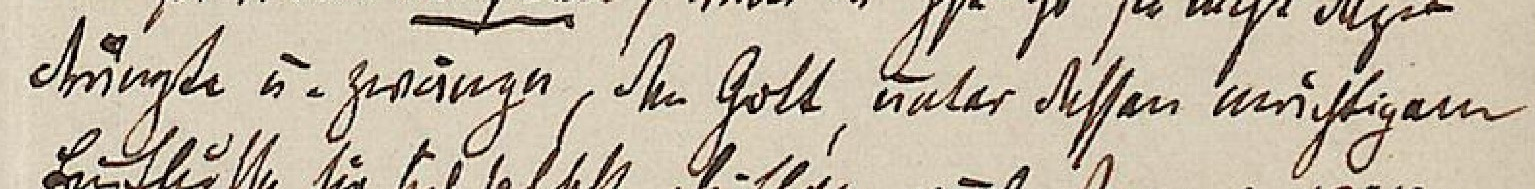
drängte u. zwänge, den Gott, unter dessen mächtigen
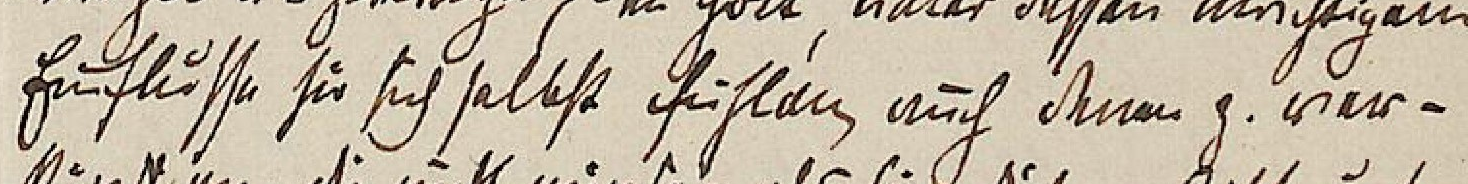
Einflusse für sich selbst fühlen, auch denen z. ver¬
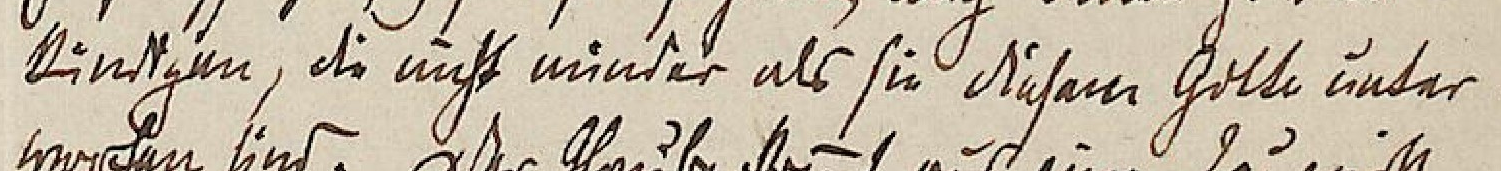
kündigen, die nicht minder als sie diesem Gotte unter¬
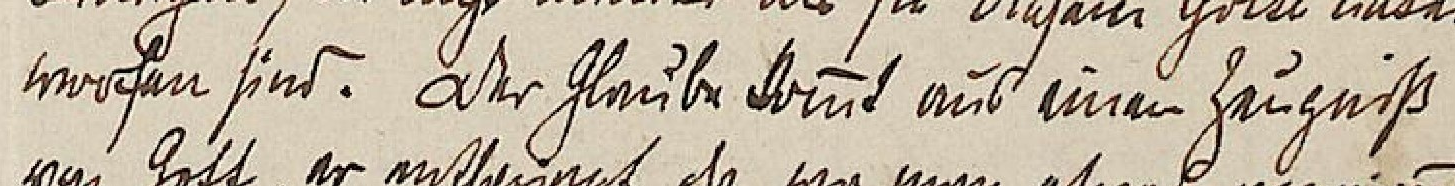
worfen sind. Der Glaube komt aus einem Zeugniß
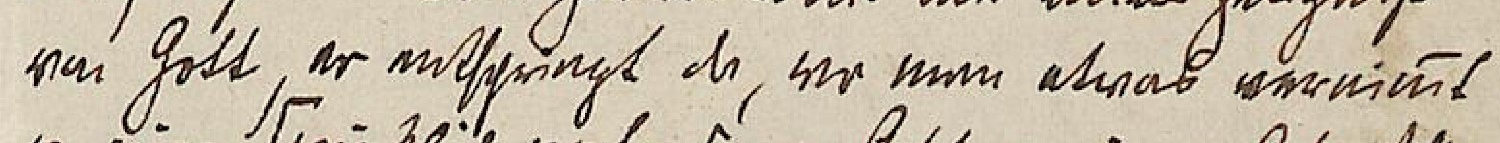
von Gott, der entspringt da, wo man etwas vernimt
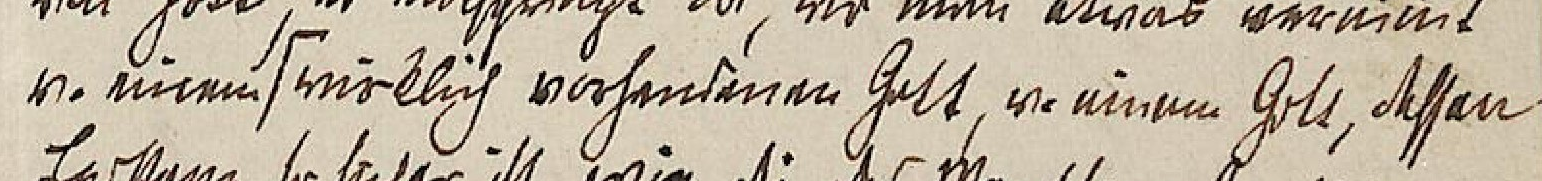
v. einem [ wirklich vorhandenen Gott, v. einem Gott, dessen
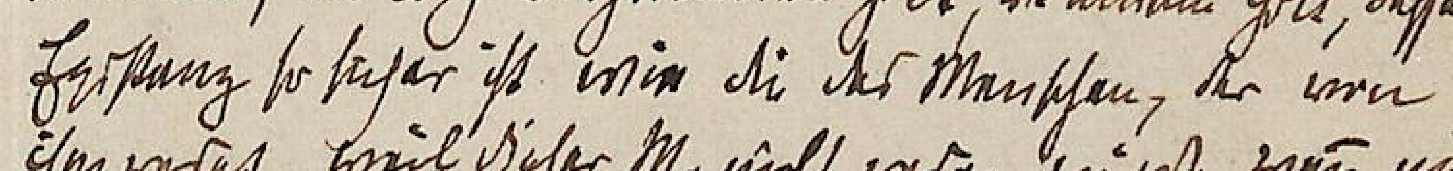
Existenz. so sicher ist wie die des Menschen, der von
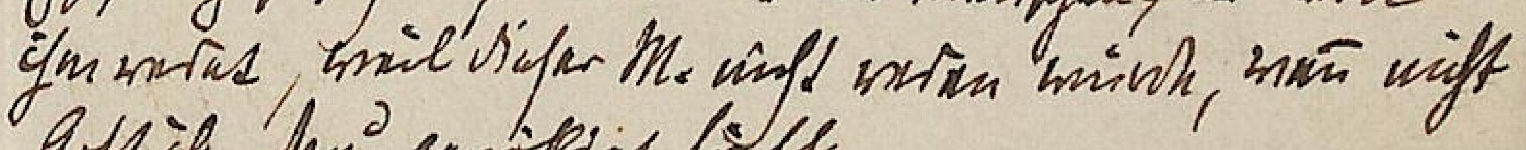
ihm redet, weil dieser M. nicht reden würden, wen nicht
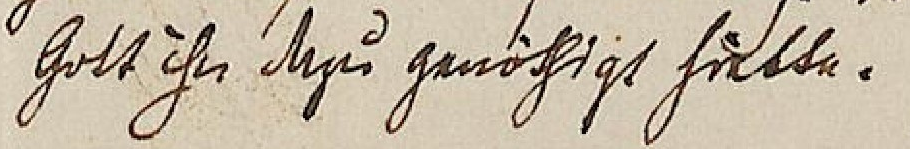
Gott ihn dazu genöthigt hätte.
